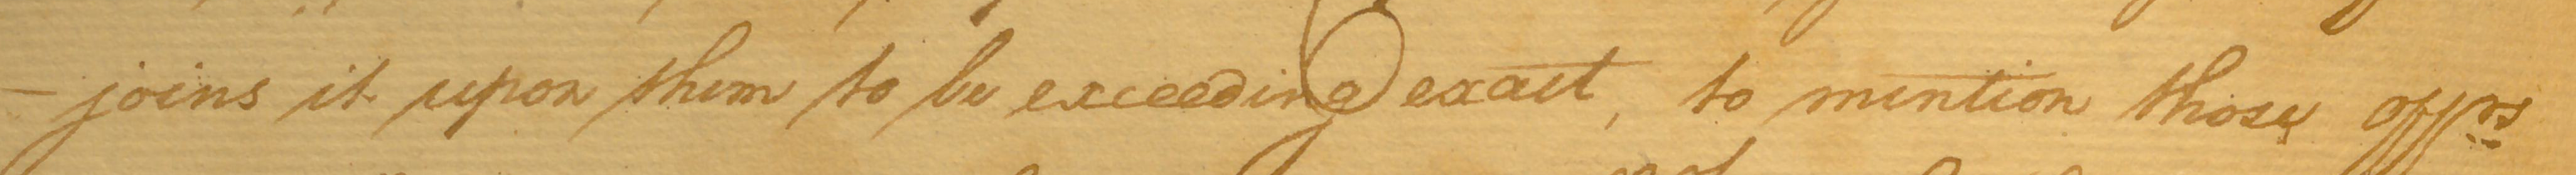-joins it upon them to be exceeding exact, to mention those off^rs
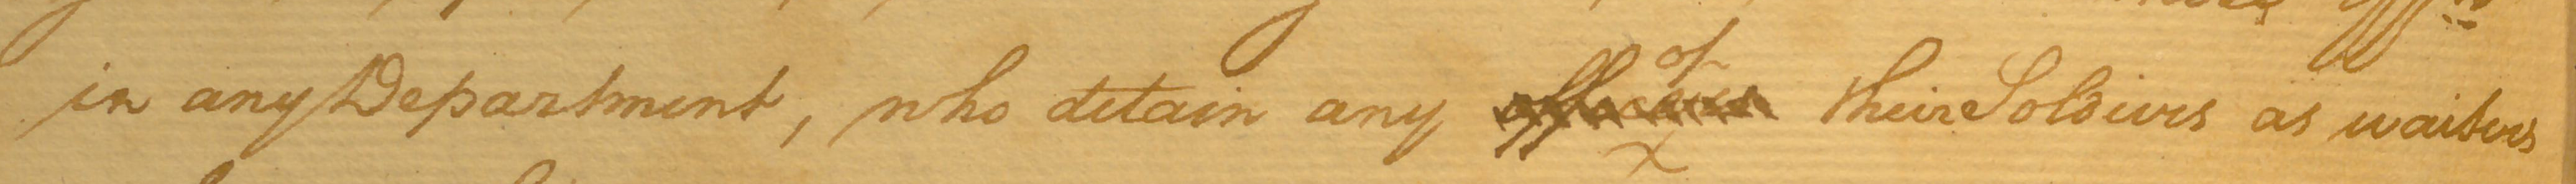in any Department, who detain any [officer] ^of their soldiers as waiters
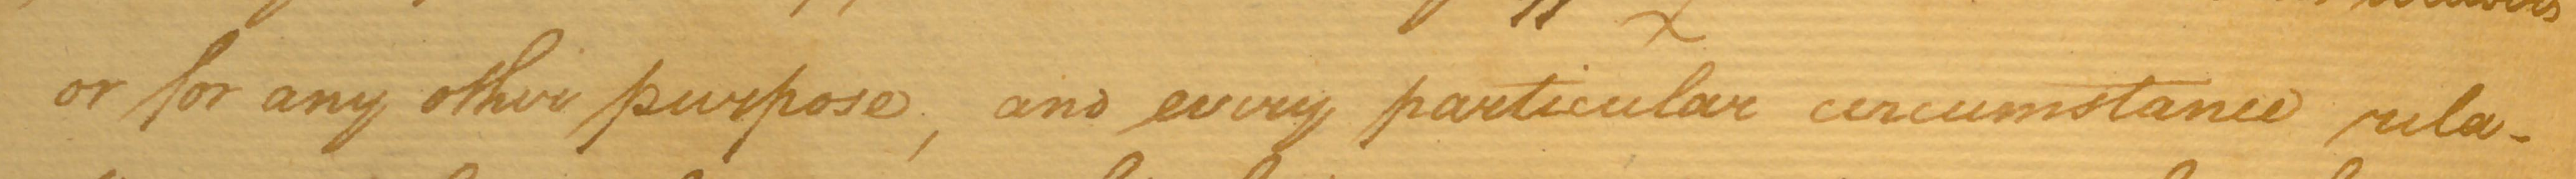or for any other purpose, and every particular circumstance rela-
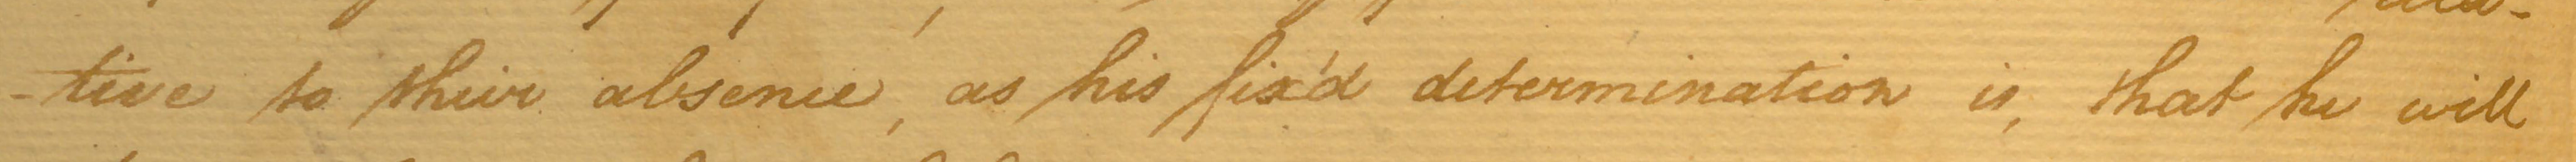-tive to their absence, as his fix'd determination is, that he will
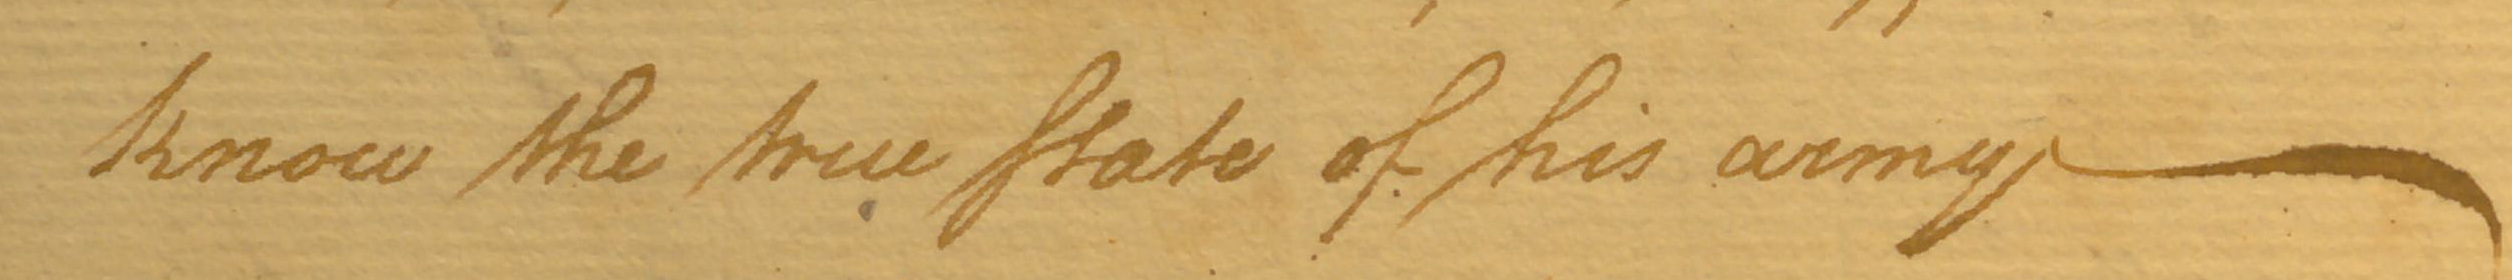know the true state of his army-
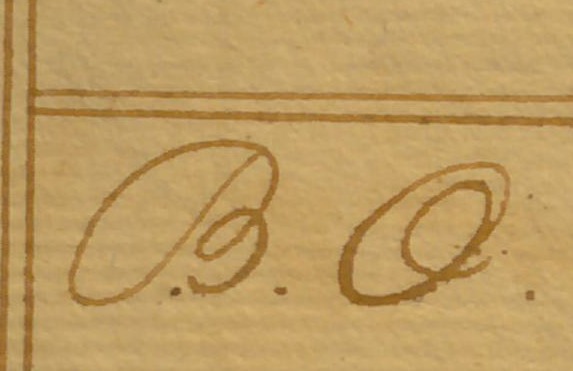B. O.
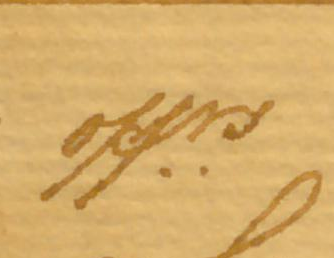off^rs.
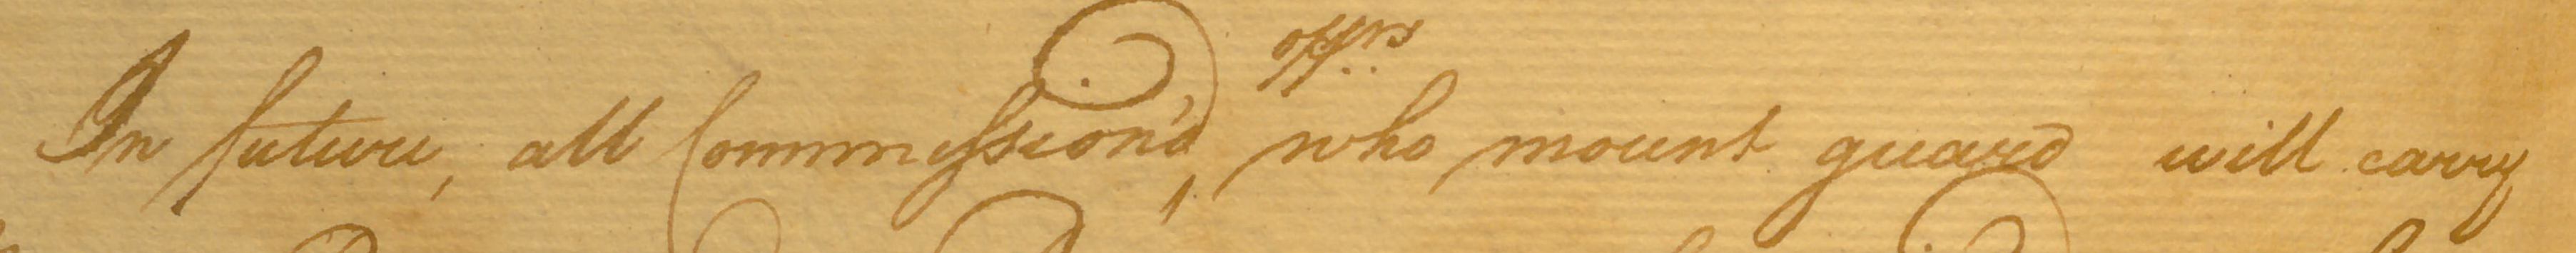In future, all Commission'd ^ who mount guard will carry
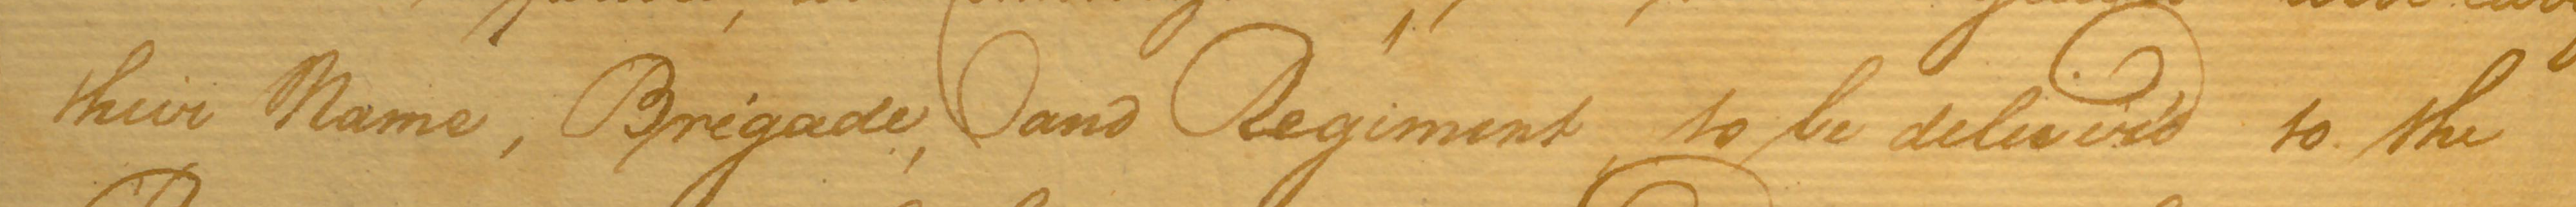their Name, Brigade, and Regiment, to be deliver'd to the
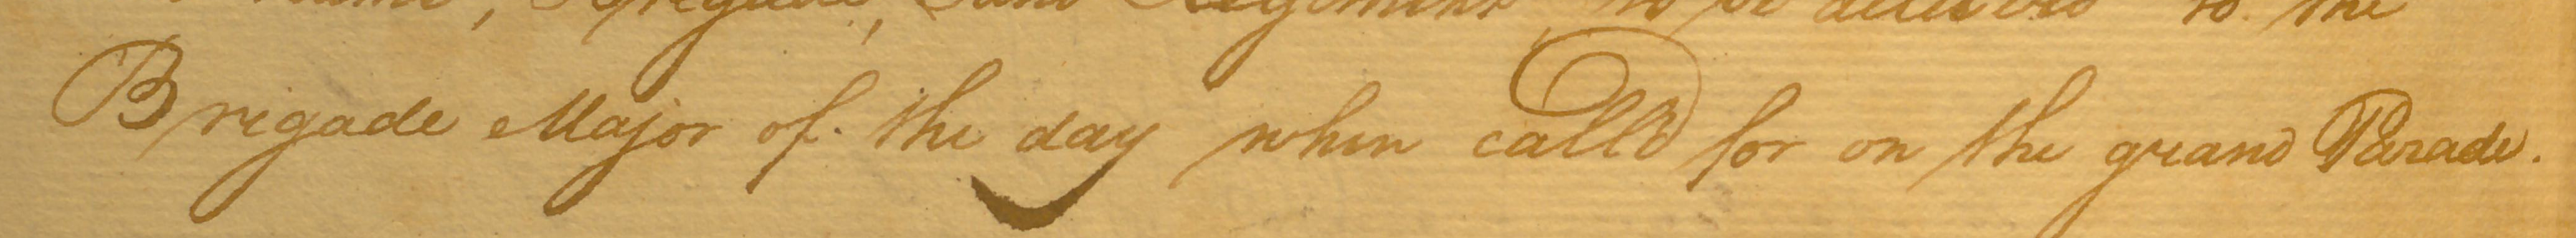Brigade Major of the day when call'd for on the grand Parade.
